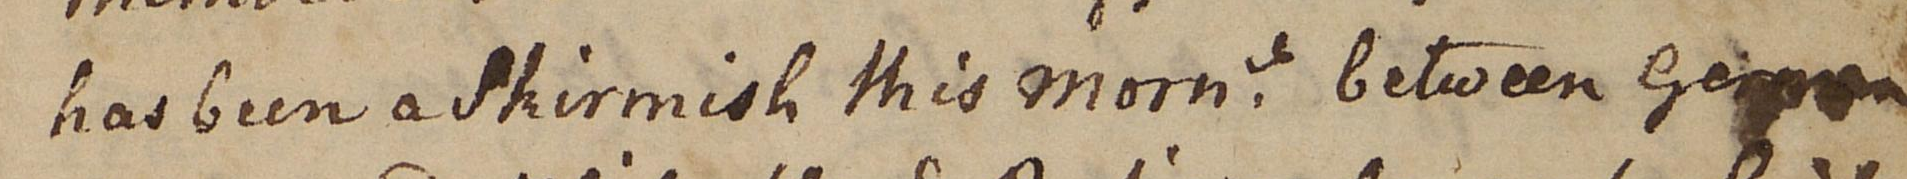has been a Skirmish this morn^g. between German
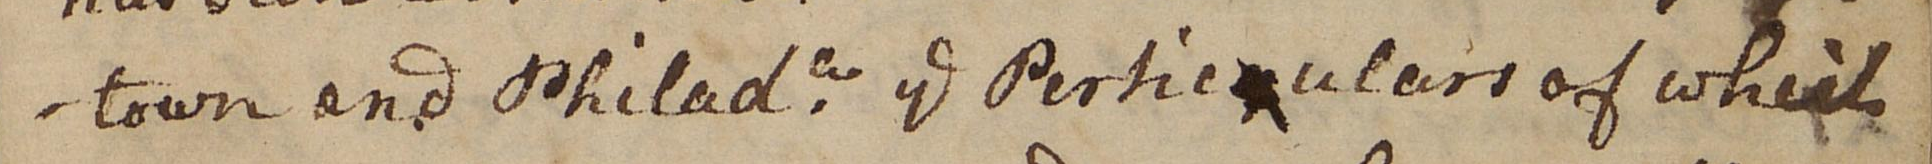-town and Philad^a. y^e Pertic[_]ulars of which
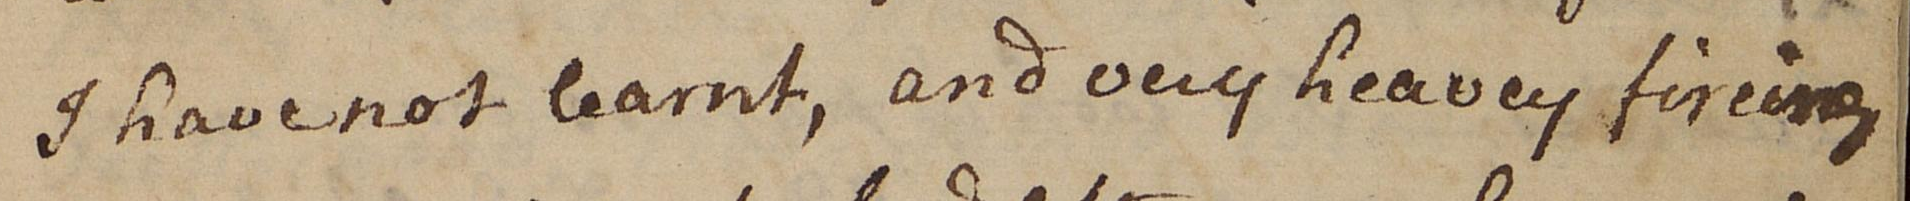I have not learnt, and very heavey fireing
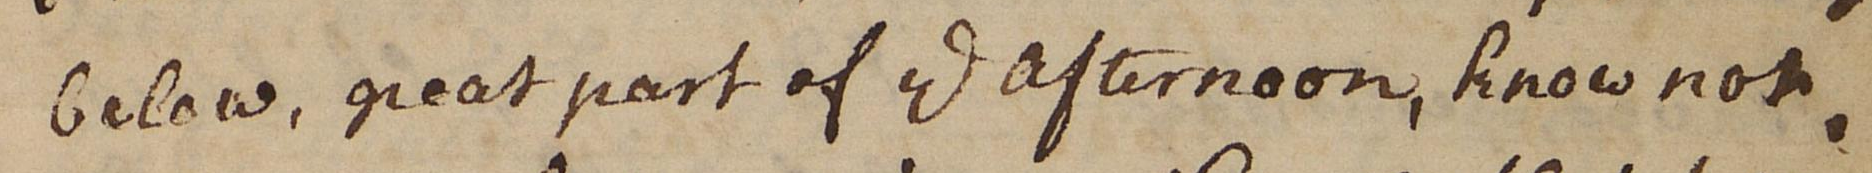below, great part of y^e afternoon, know not
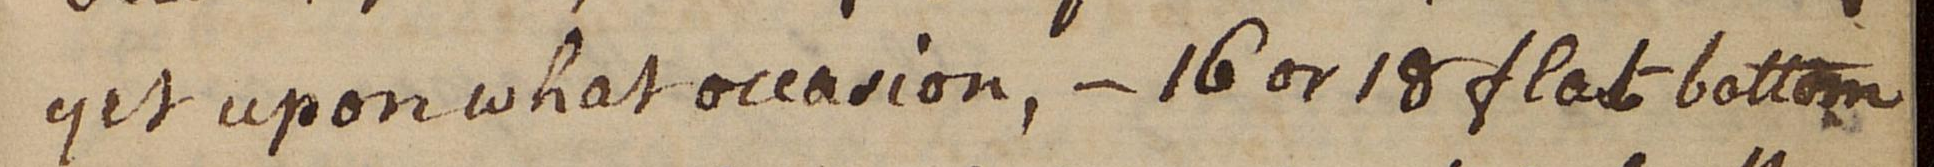yet upon what occasion,- 16 or 18 flat bottom
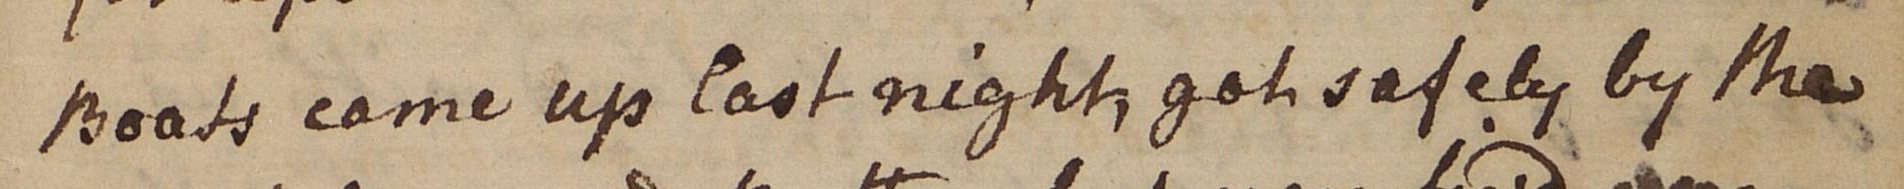Boats came up last night, got safely by the
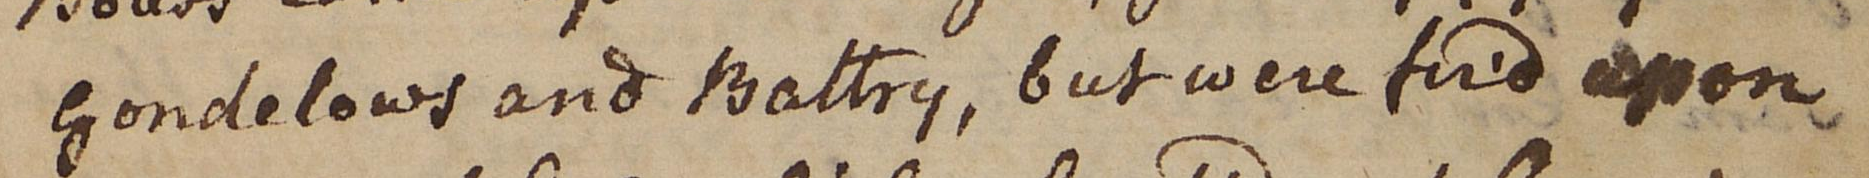Gondelows and Battry, but were fir'd upon
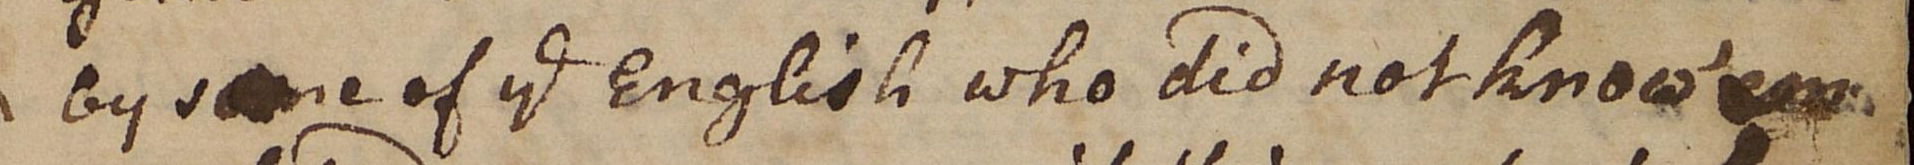by some of y^e English who did not know 'em
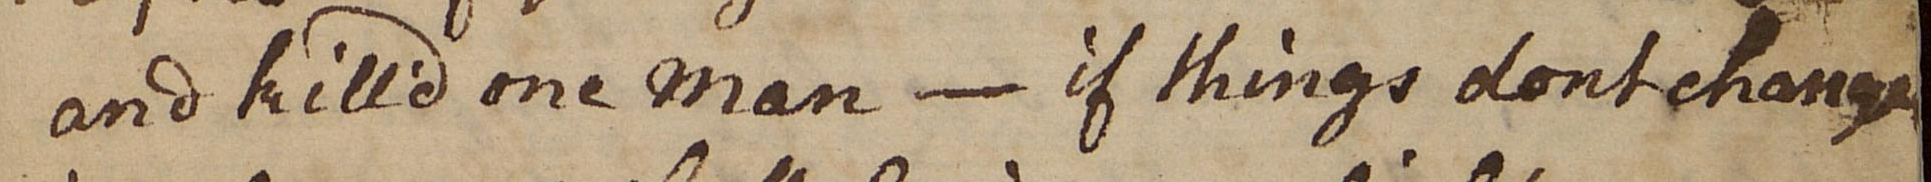and kill'd one man- if things dont change
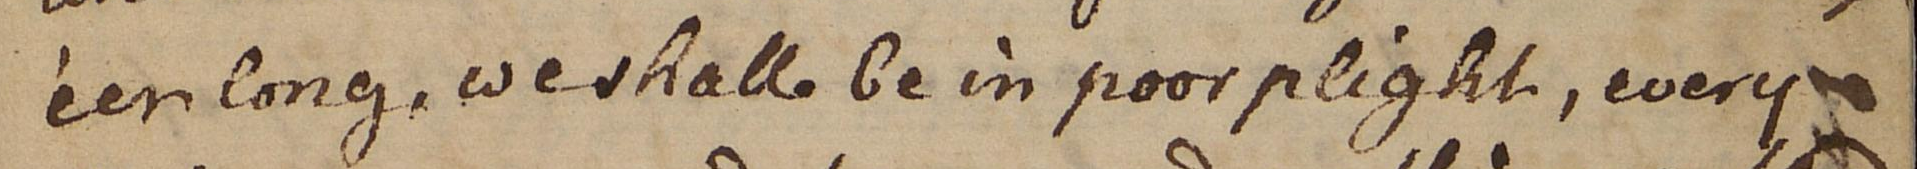'een long, we shall be in poor plight, every
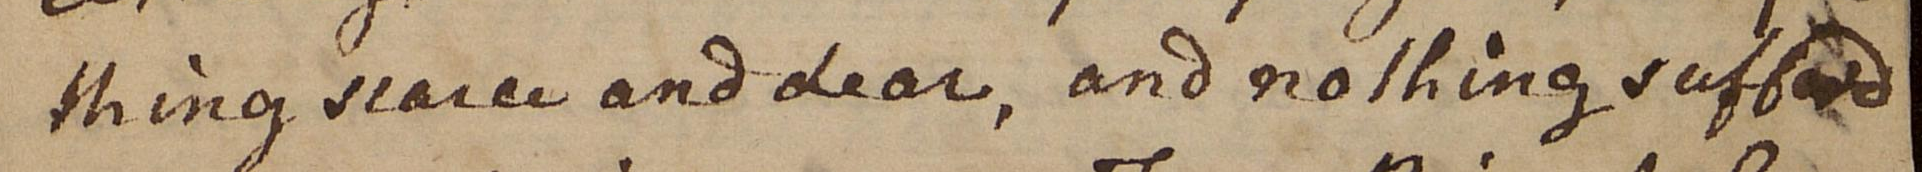thing scarce and dear, and nothing suffer'd
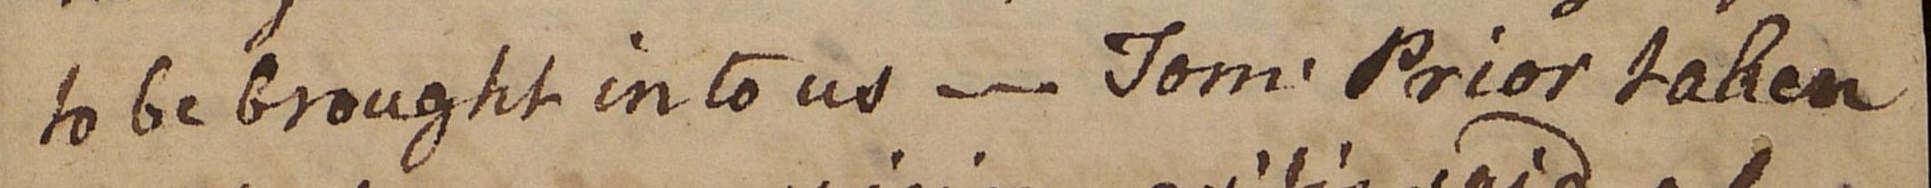to be brought in to us- Tom Prior taken
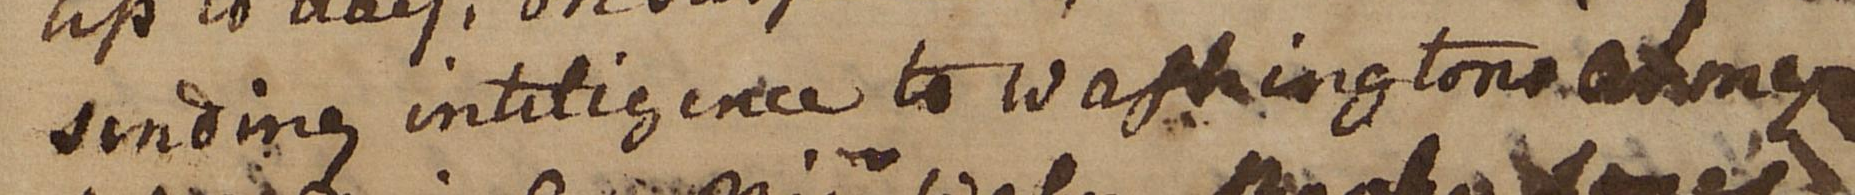sending intiligence to Washingtons Army
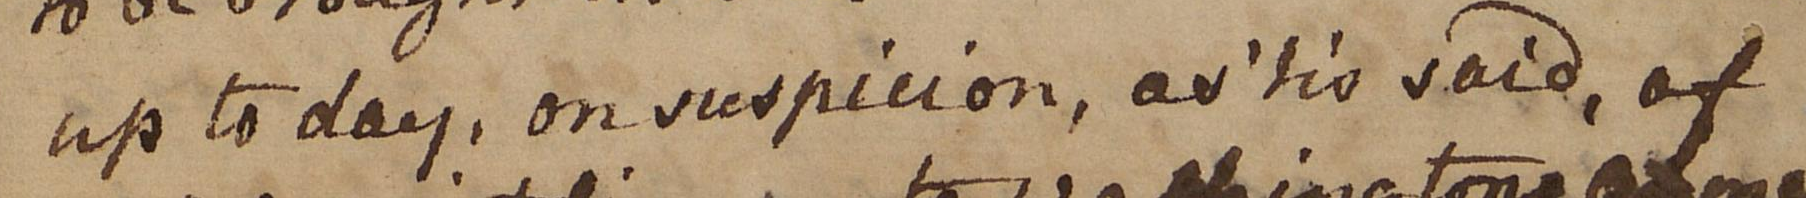up to day, on suspicion, as 'tis said, of
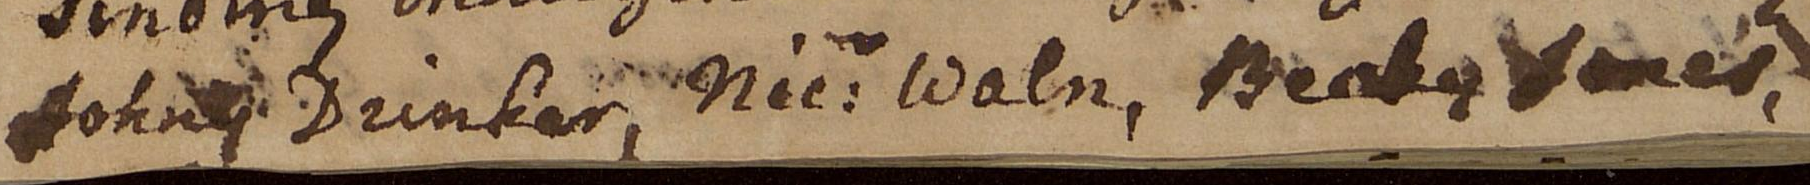Johny Drinker, Nic: Waln, Becky Jones,
